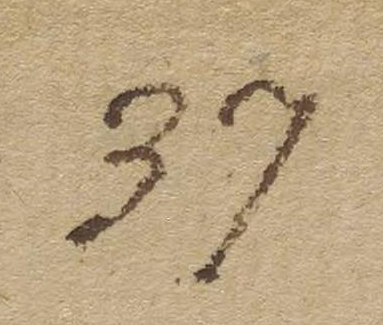37
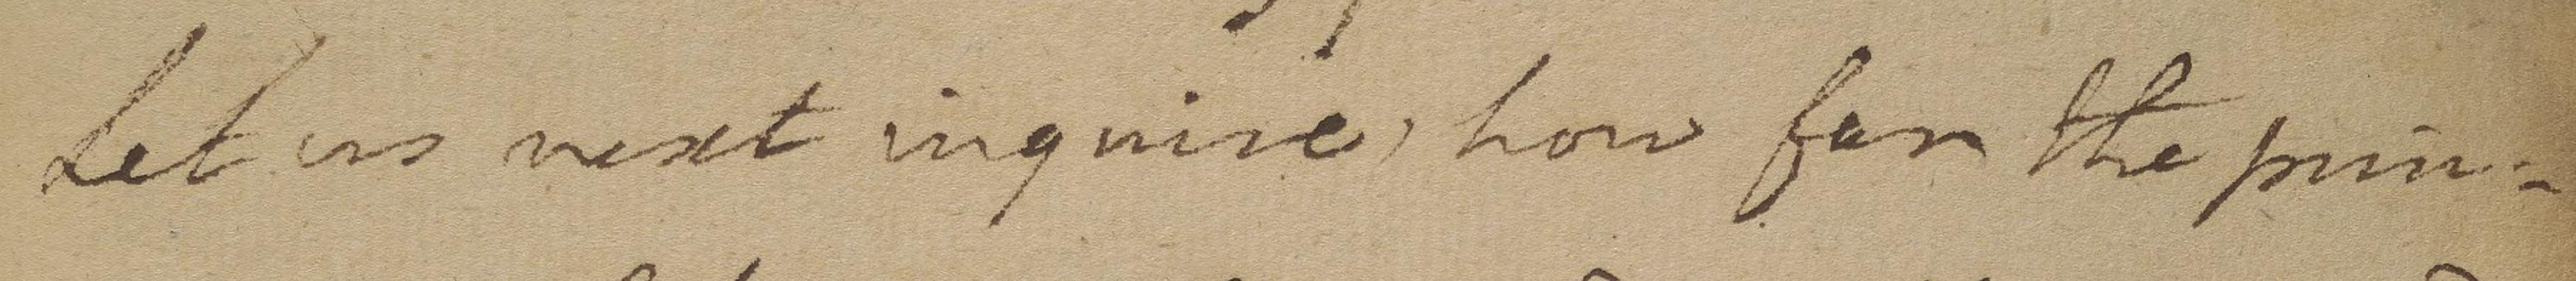Let us next inquire how far the prin-
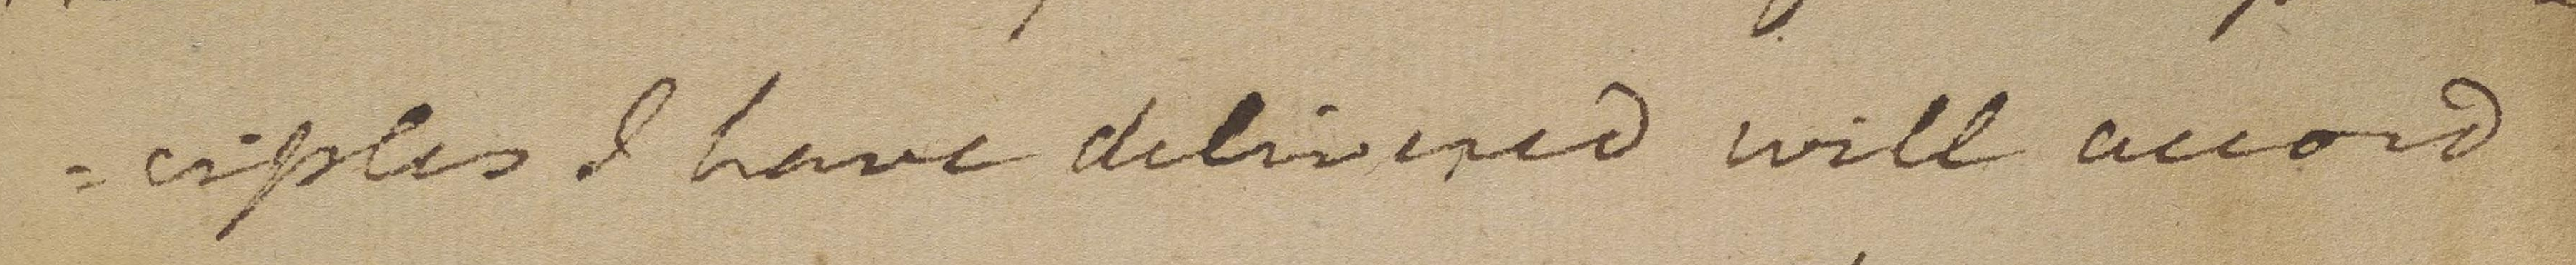-ciples I have delivered will accord
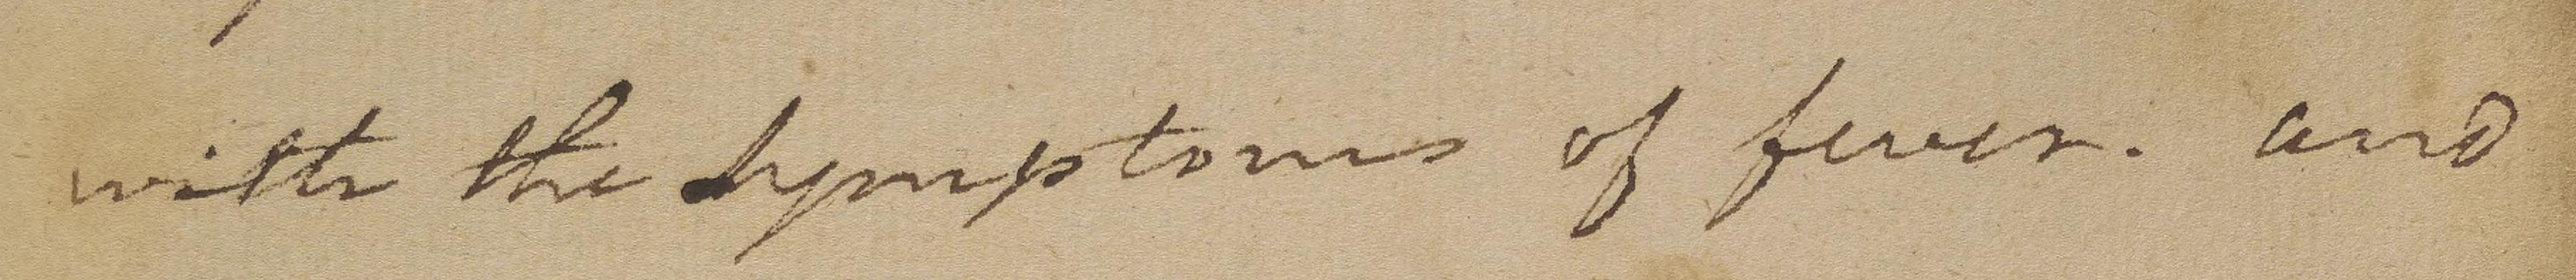with the symptoms of fever, and
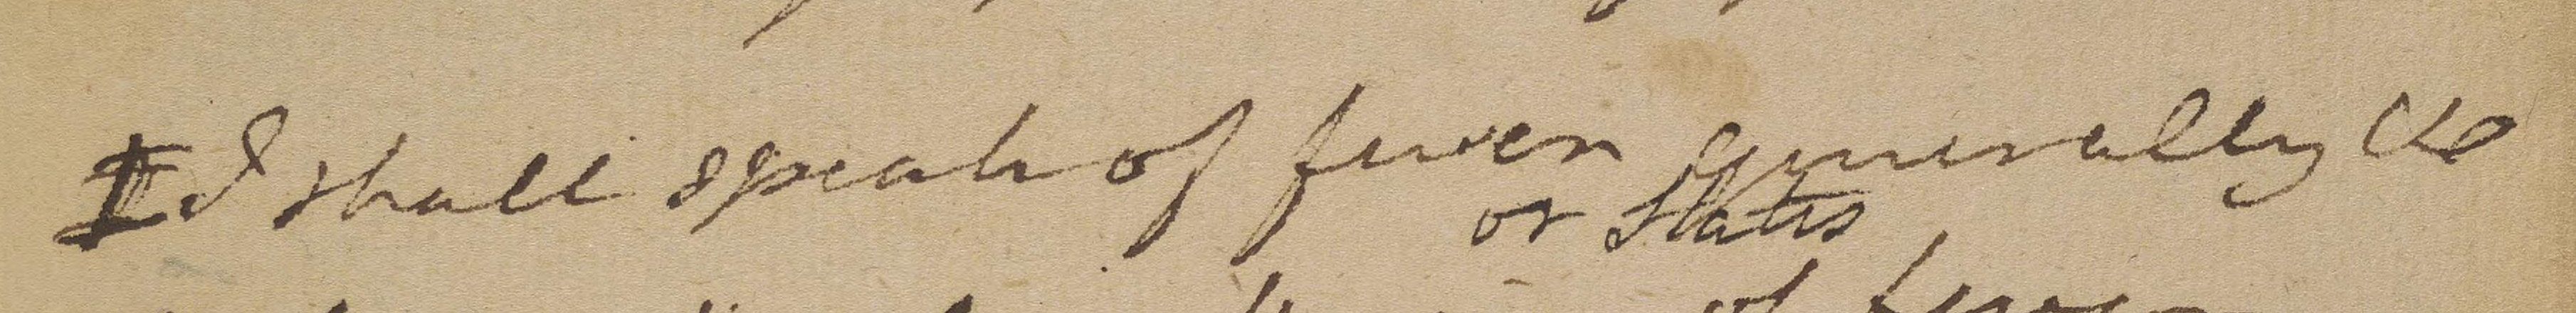I I shall speak of fever generally &
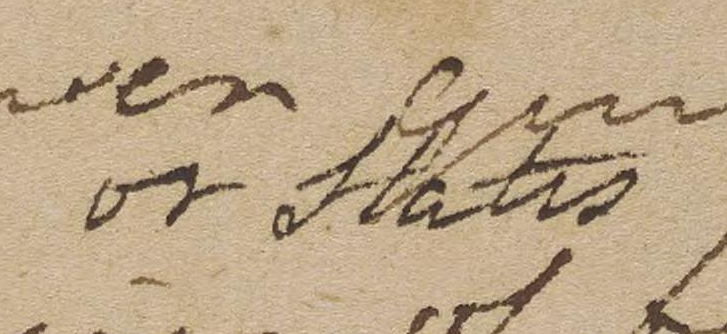or States
